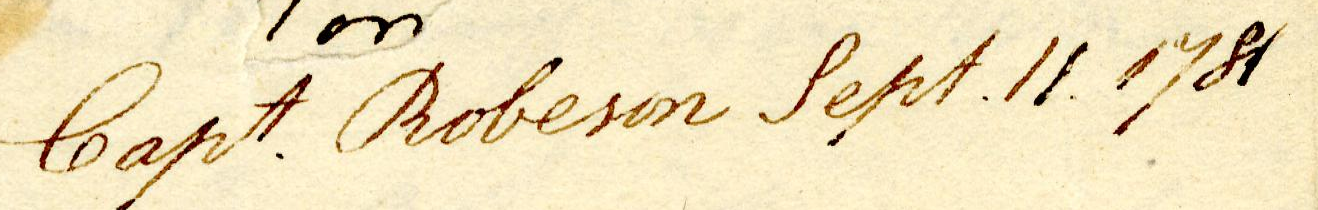Cap^t. Robeson Sept. 11. 1781
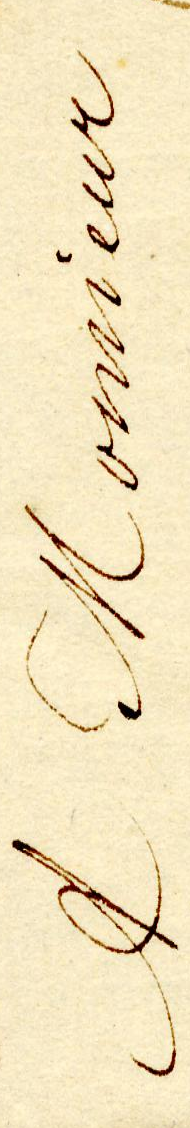A Monsieur
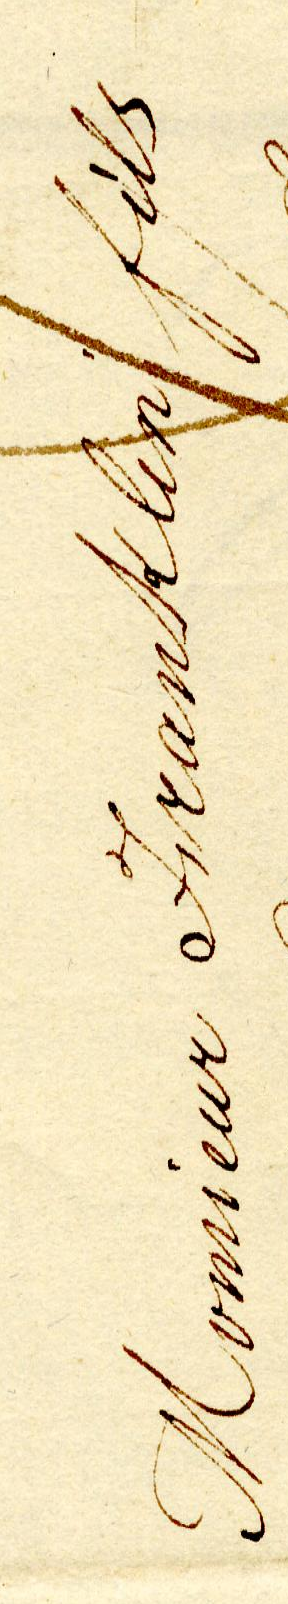Monsieur Franklin fils
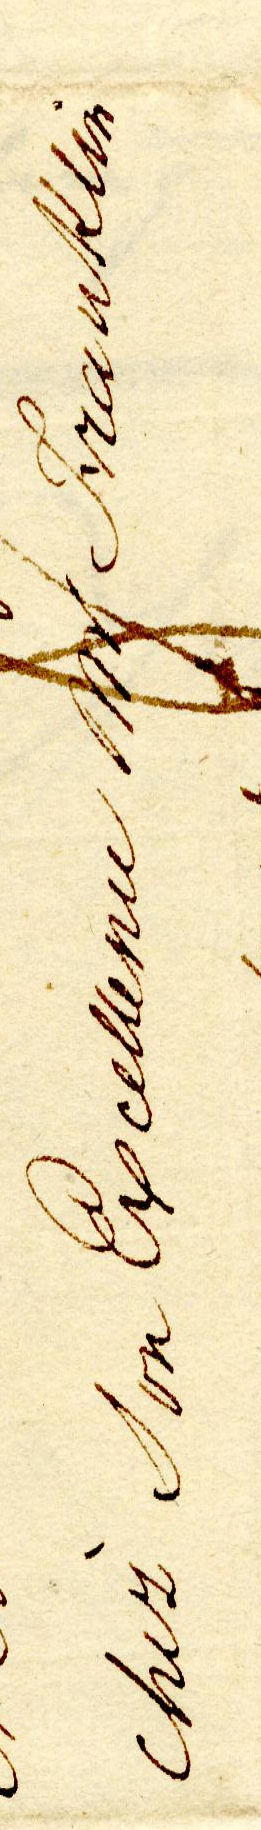chèz Son Excellence mr Franklin
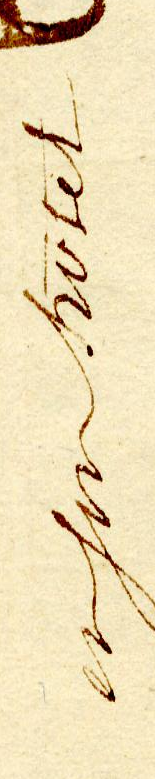en son hotel
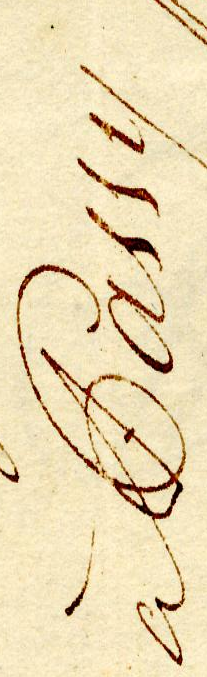à Passy
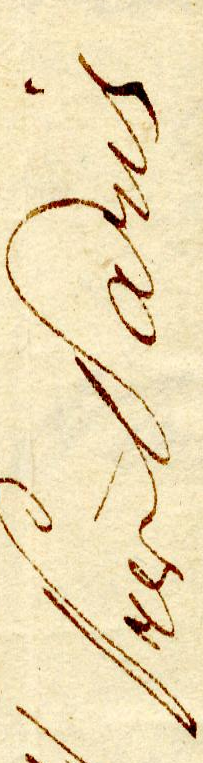Près Paris
